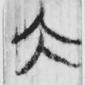大
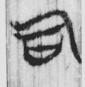司
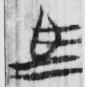馬
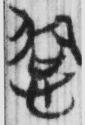○（悼）
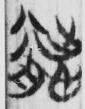○（滑）
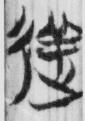𨒫（將）
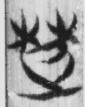楚
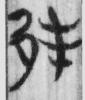邦
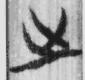之
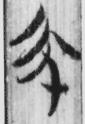帀（師）
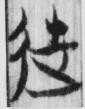徒
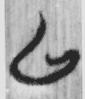㠯（以）
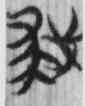○（救）
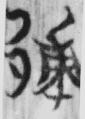郙
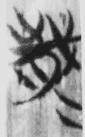歲
